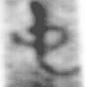屯
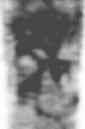○（豻）
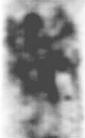與
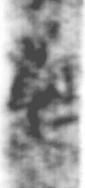○（貍）
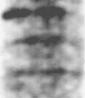三
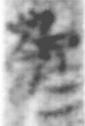○（貍）
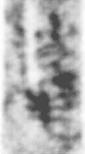○（貘）
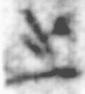之
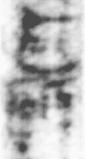聶（攝）
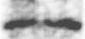一
